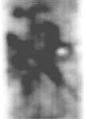綏
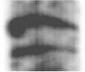二
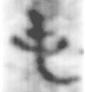屯
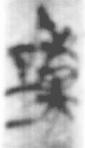○（纁）
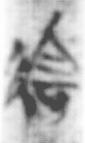○（組）
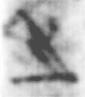之
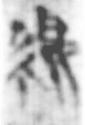綏
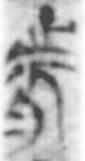○（虎）
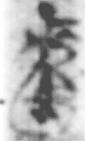○（韔）
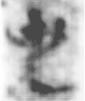屯
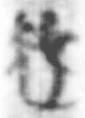狐
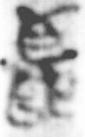聶（攝）
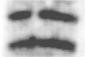二
